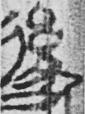後
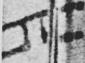亓（其）
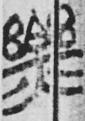樂
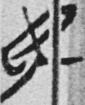𡚦
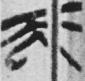而
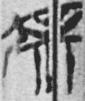○（遲）
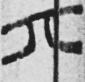亓（其）
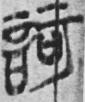訶（歌）
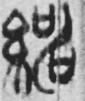紳（引）
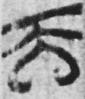而
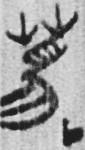○（逖）
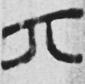亓（其）
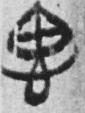思
